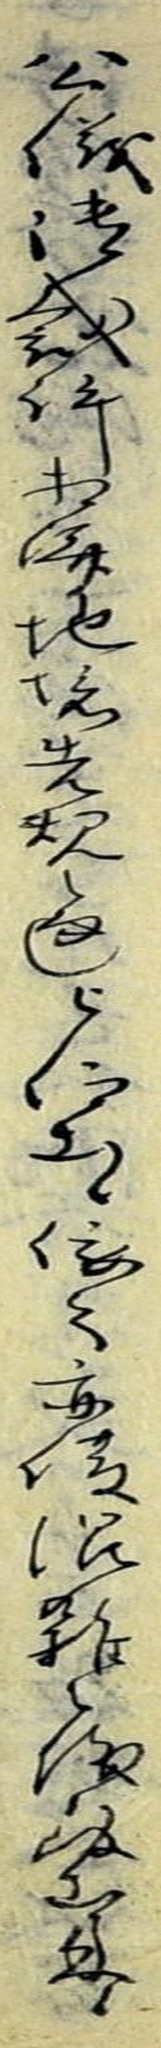公儀御裁許相済地境先規之通被仰出候依之亦復混雑之儀致出来候
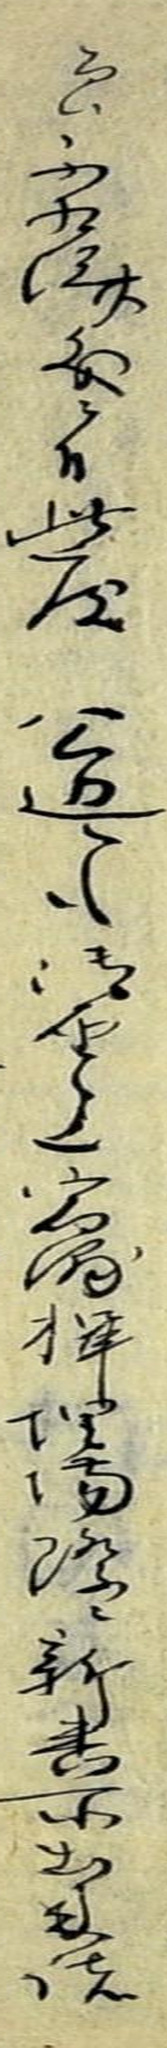而ハ不相済義ニ付此度公辺へも御届之上宿浦楫埋場際ニ新番所出来諸
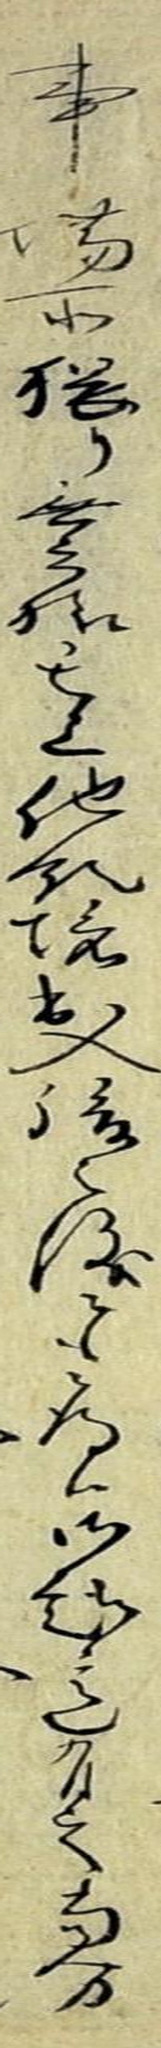事場所猥り無之様其上他領境出入渡之儀ニも候得ハ御趣意有之当分
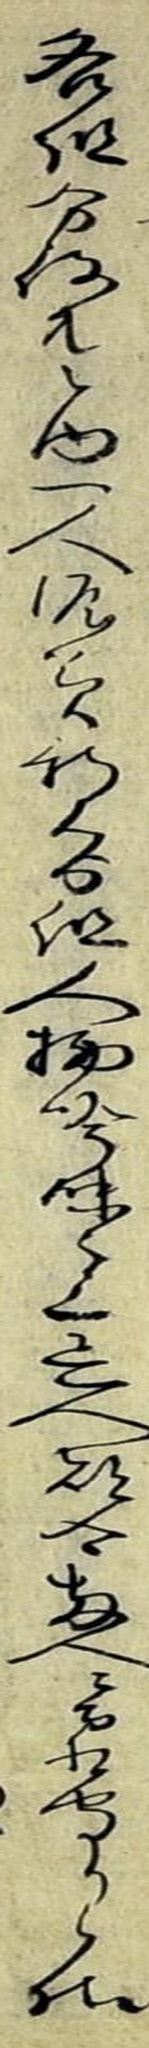各組分役共之内一人渥美新右衛門組人柄吟味之上壱人都合両人ニ而相守り候様
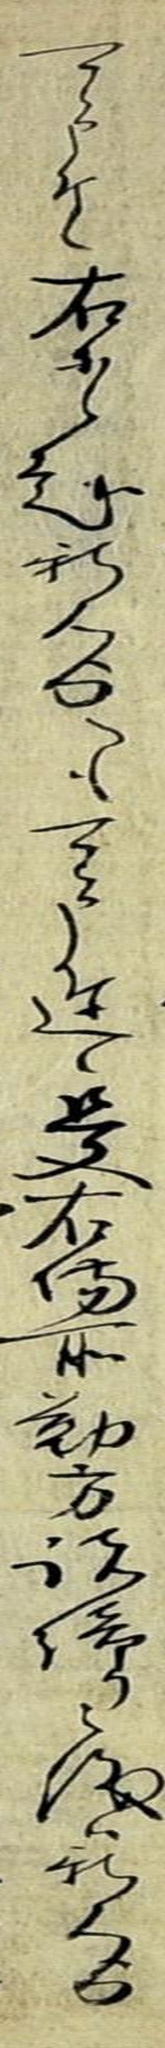可被申付候右等之趣新右衛門へも可被申達候且又右場所勤方諸締り之儀ハ新右衛門
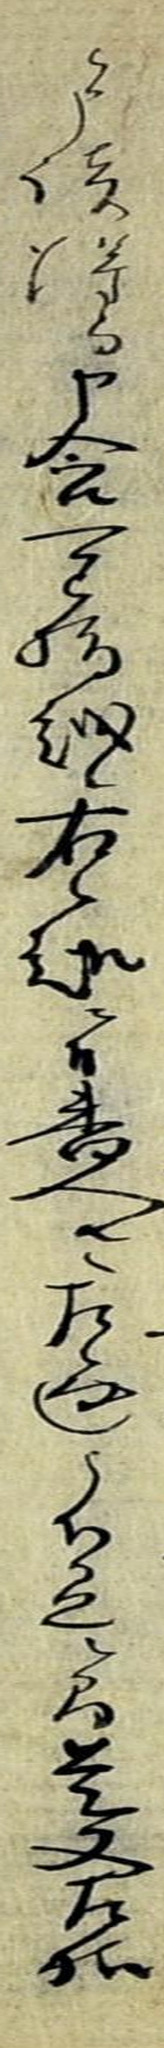被申談得与申含可被指越候右之趣ニ付番人共へ左之通被下置候間是又左様
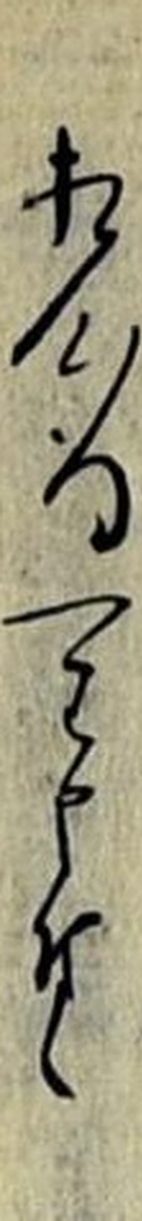相心得可被申付候
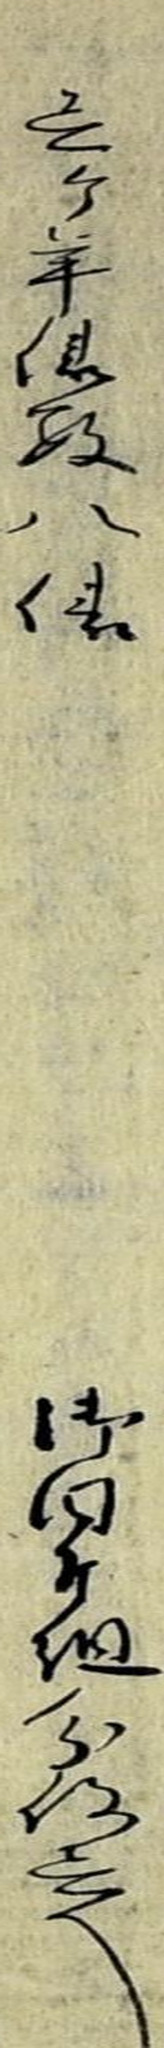壱ケ年俵数八俵御目付組分役壱人
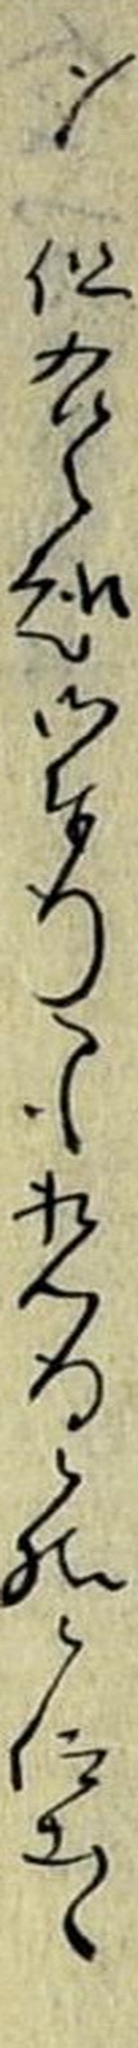〆但右之趣御奉行へも相心得候様被仰出候
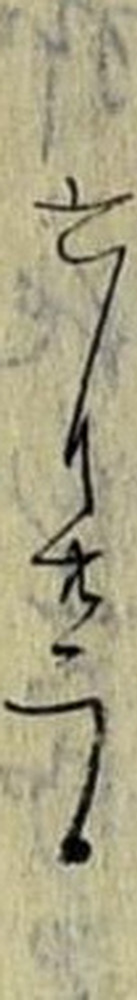六月廿二日
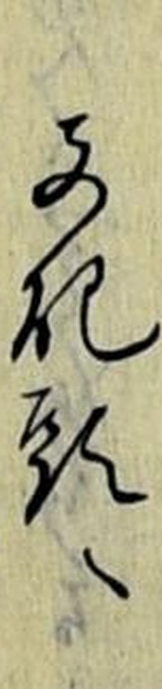支配頭へ
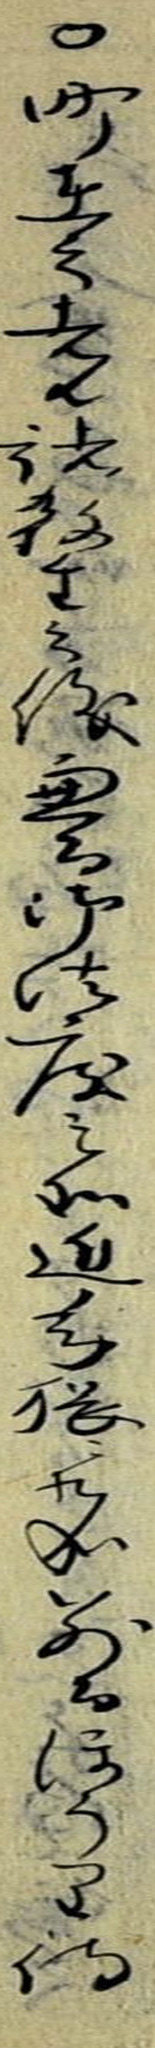〇町在之者共諸殺生之儀兼而御法度之処近年猥ニ相成別而ほうり伝
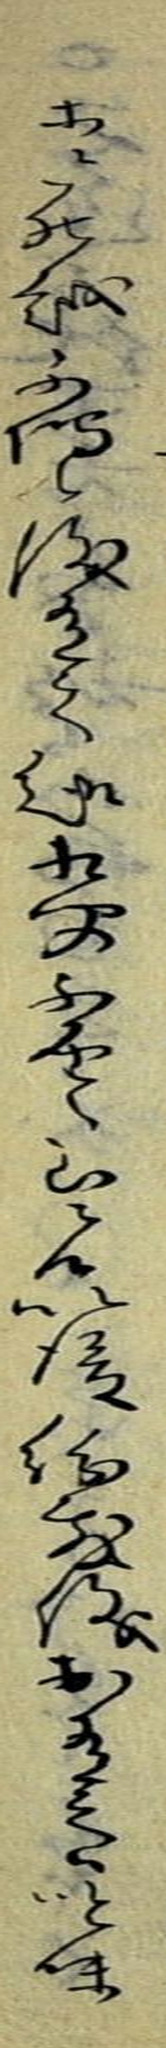等ニ罷越不埒之儀有之趣相聞不届之至ニ候以後紛敷儀於有之ハ吟味
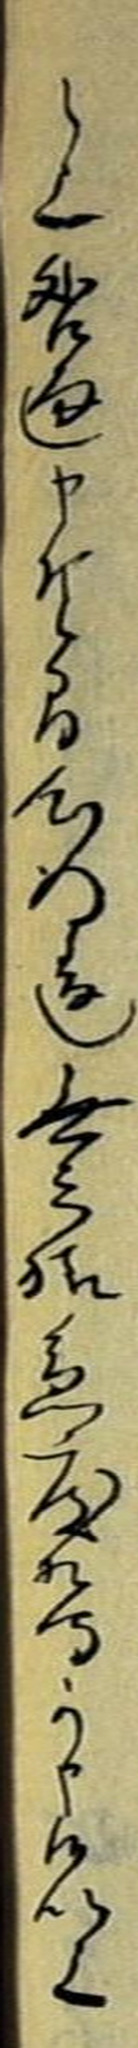之上咎通申付候間心得違無之様急度相守可申候以上
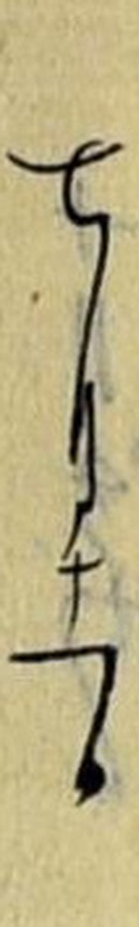七月十一日
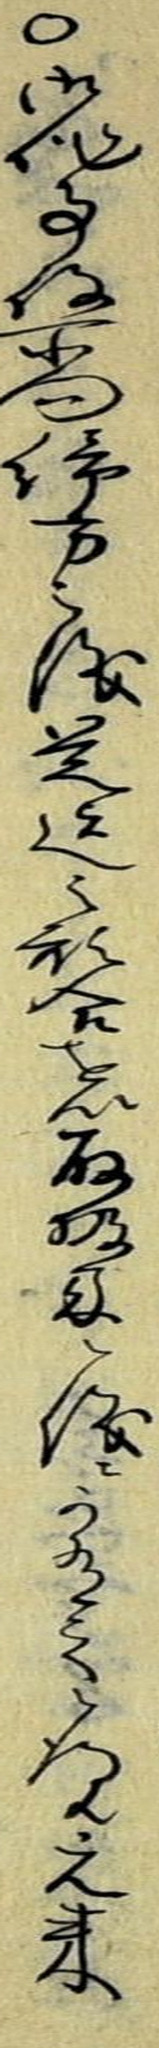〇御作事役所向締方之儀是迄之形合を以取扱来候儀ニ可有之候得共元来
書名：命令之部 三
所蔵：福井県文書館 Fukui Prefectural Archives
